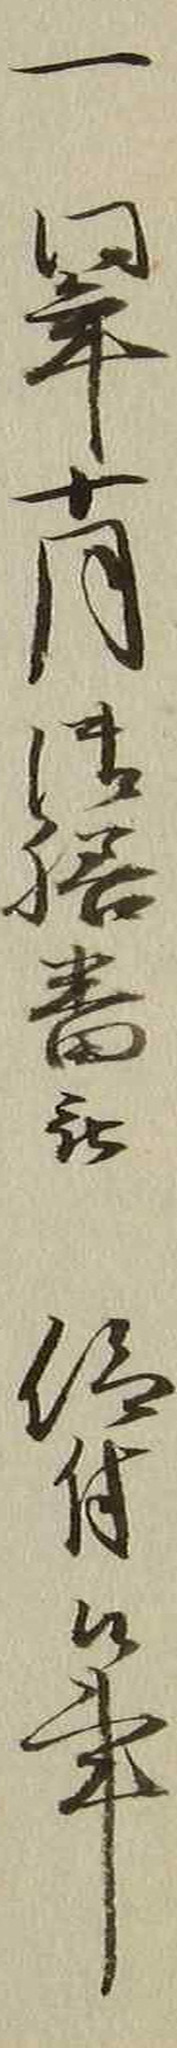一同年十月御膳番被仰付候事
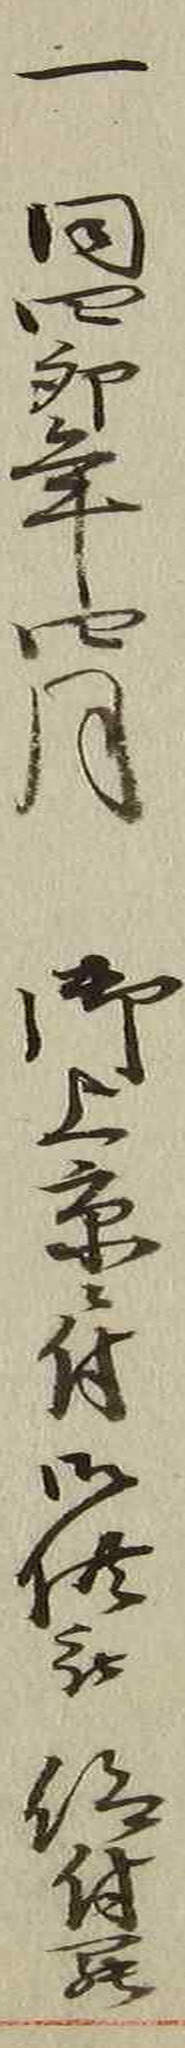一同四夘年四月御上京に付御供被仰付罷
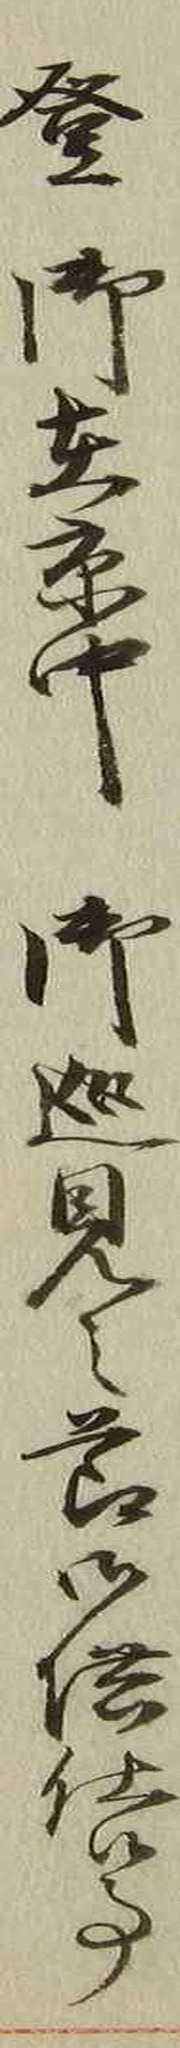登御在京中御順見之節御供仕候事
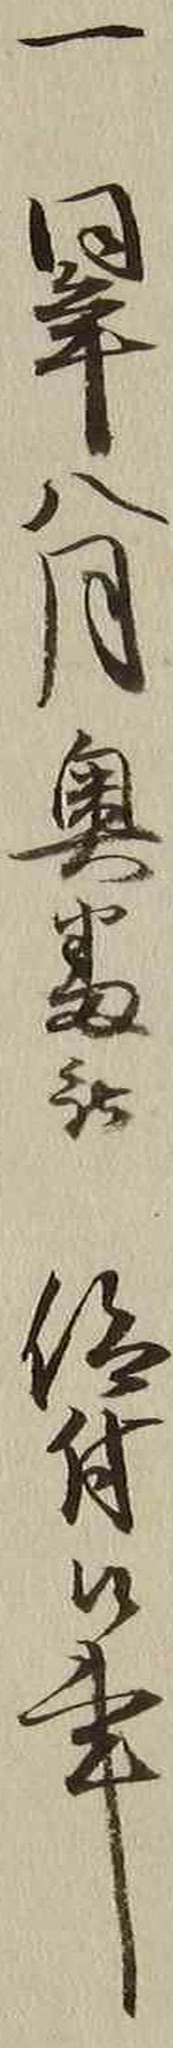一同年八月奥番被仰付候事
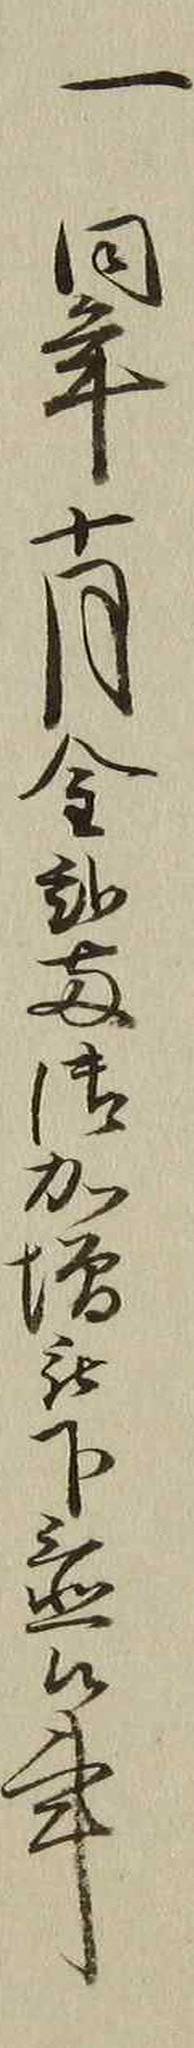一同年十月金弐両御加増被下置候事
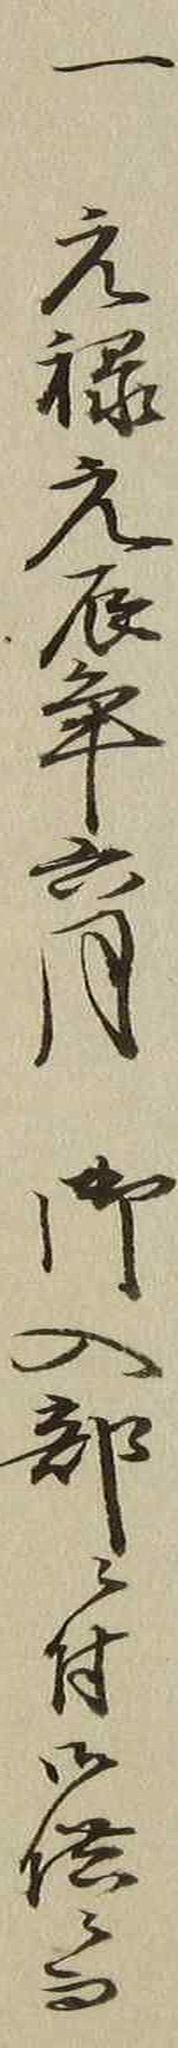一元禄元辰年六月御入部ニ付御供ニ而
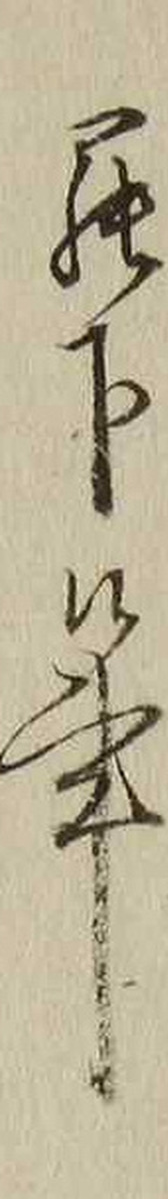罷下候事
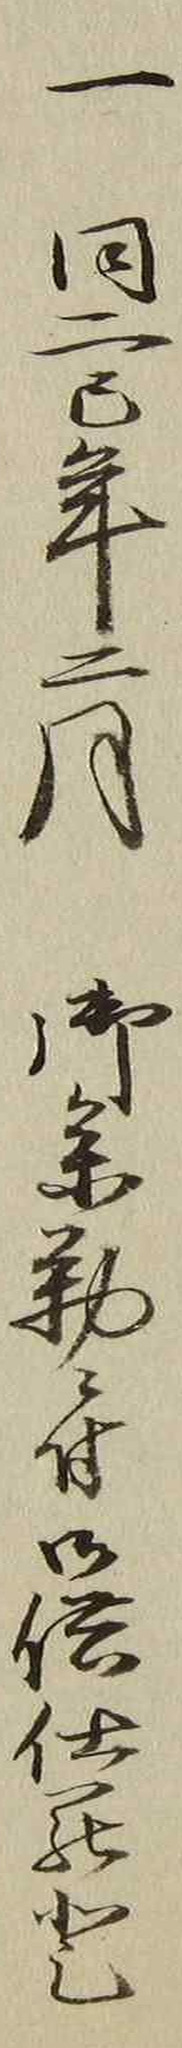一同ニ巳年二月御参勤ニ付御供仕罷登
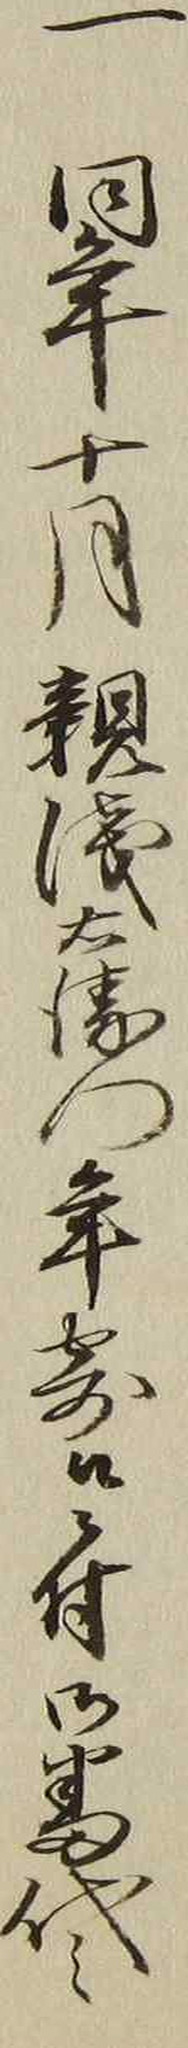一同年十月親浅右衛門年寄候ニ付御番代之
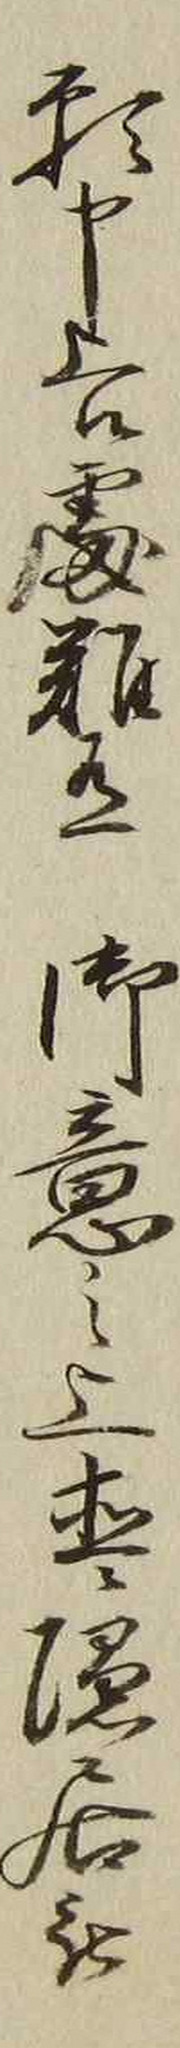願申上候處難有御意之上直ニ隠居被
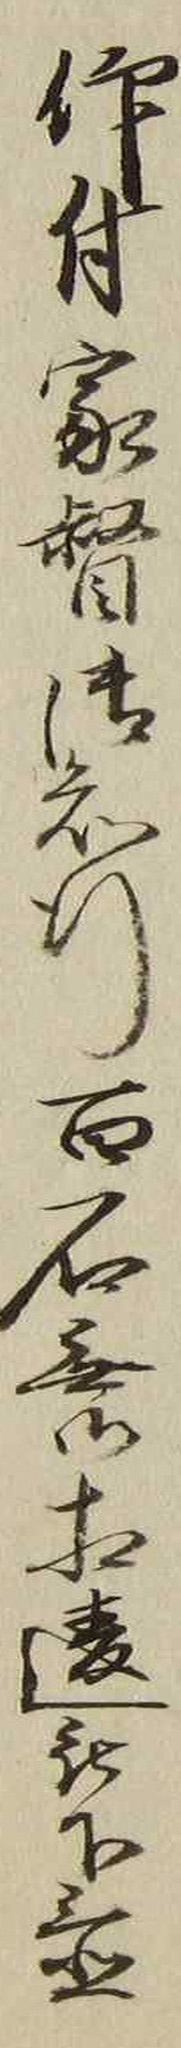仰付家督御知行百石無御相違被下置
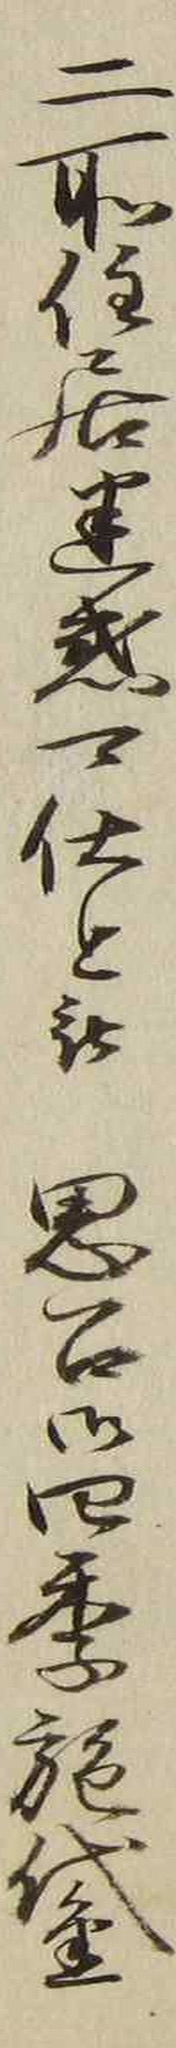二所住居迷惑可仕と被思召御四季施代金
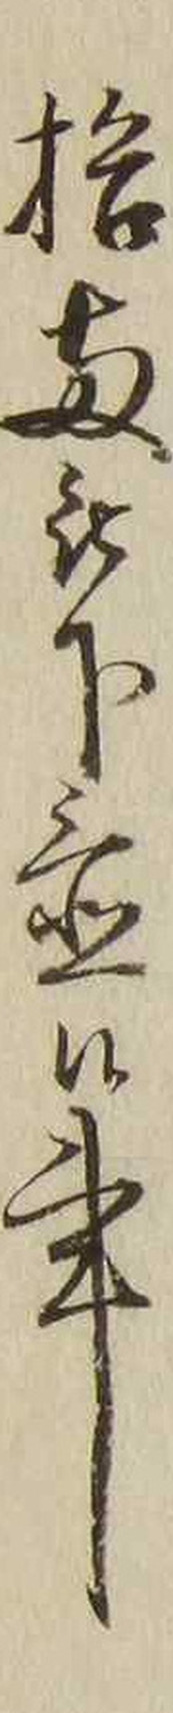拾両被下置候事

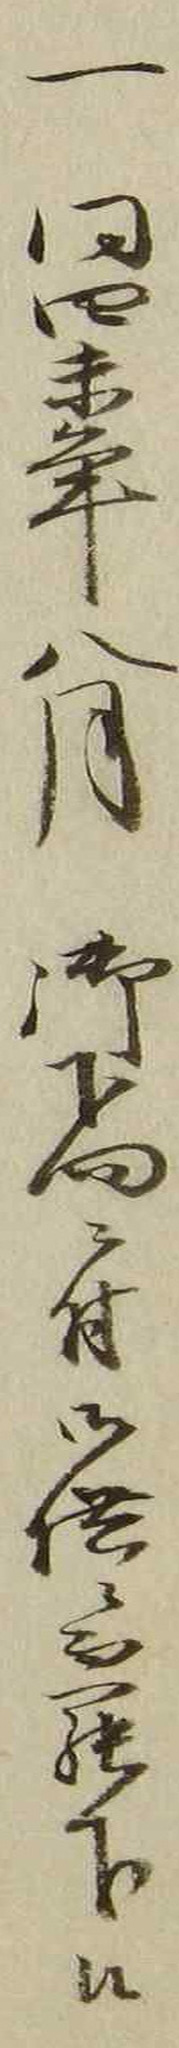一同四未年八月御下向ニ付御供ニ而罷下候
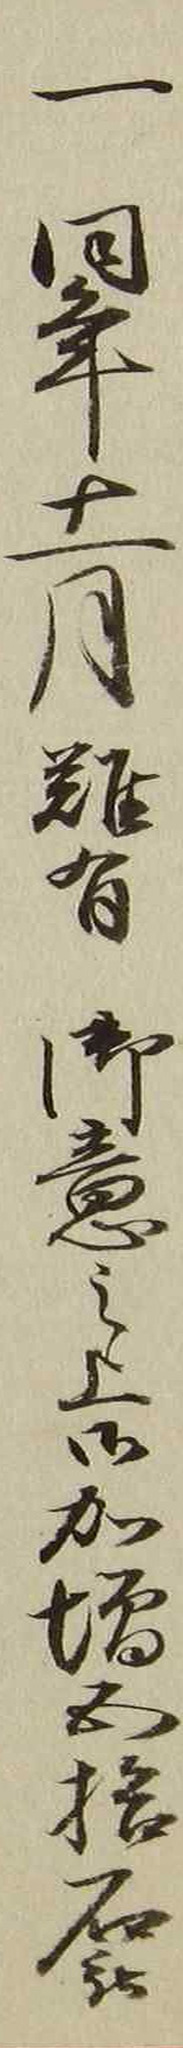一同年十一月難有御意之上御加増五拾石被
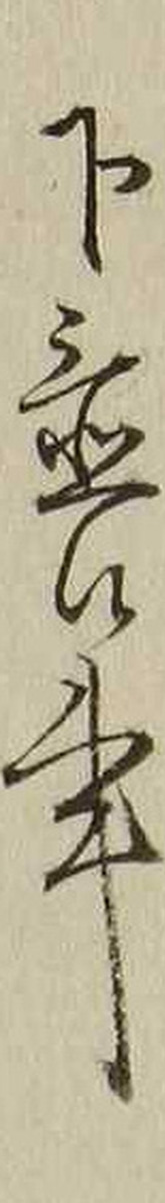下置候事
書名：諸士系譜　巻之114　か之部22
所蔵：会津若松市立会津図書館
